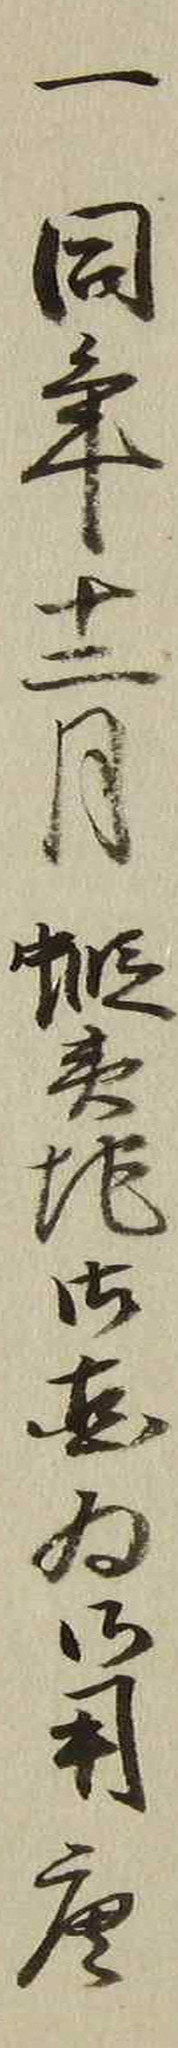一同年十二月蝦夷地御固為御用唐
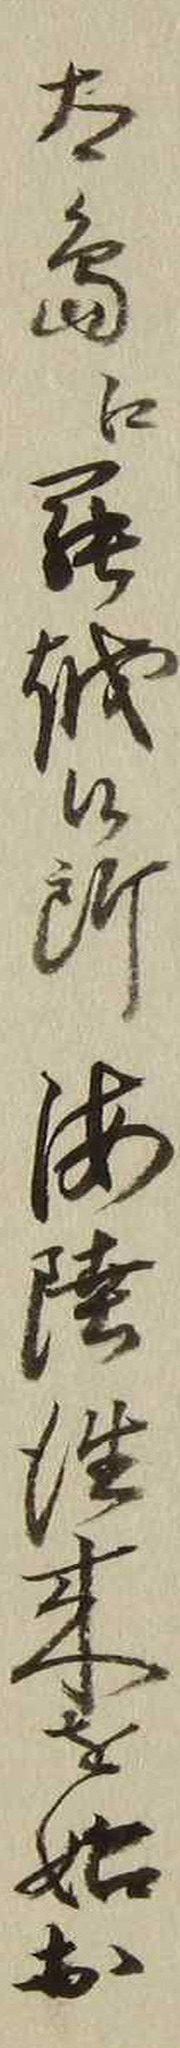太嶋江罷越候所海陸往来を始於
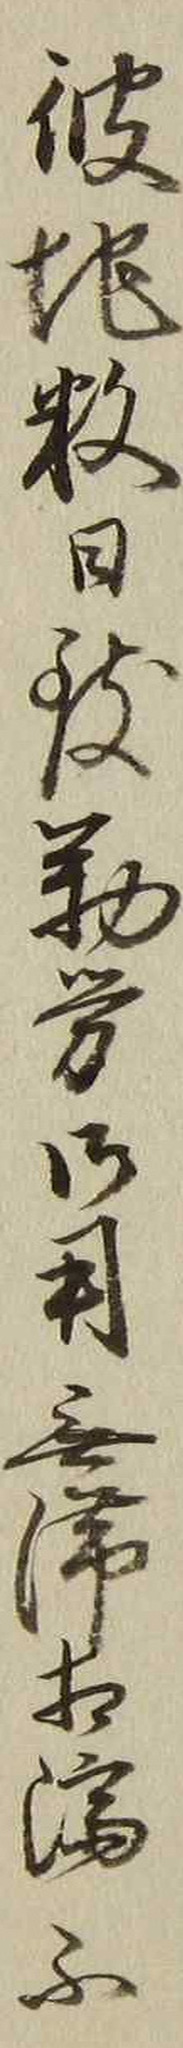彼地数日致勤労御用無滞相済不
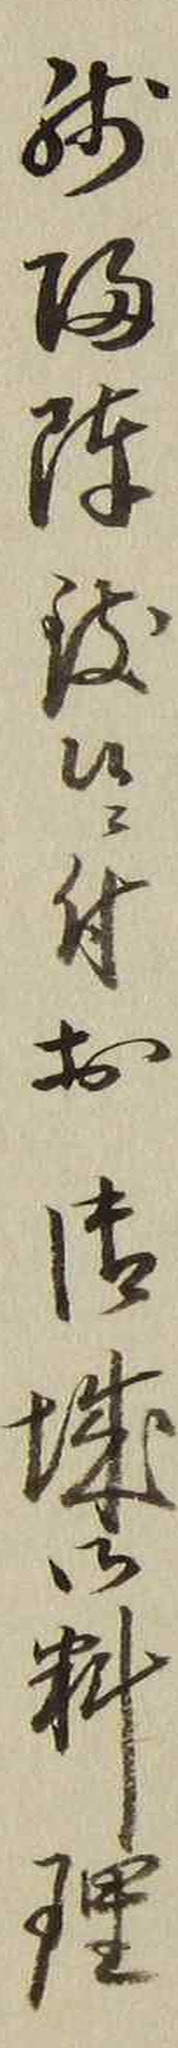残帰陣致候付に於御城御料理
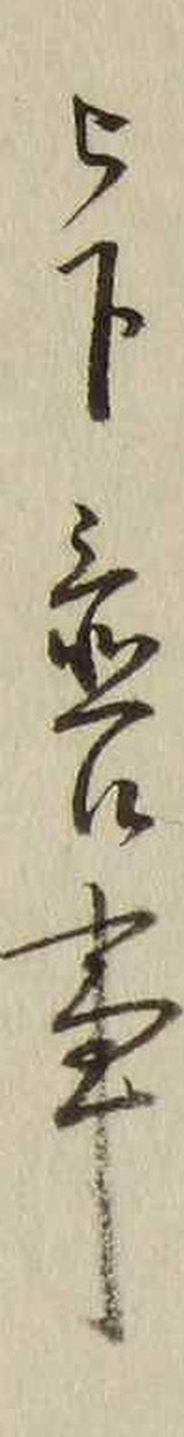被下置候事
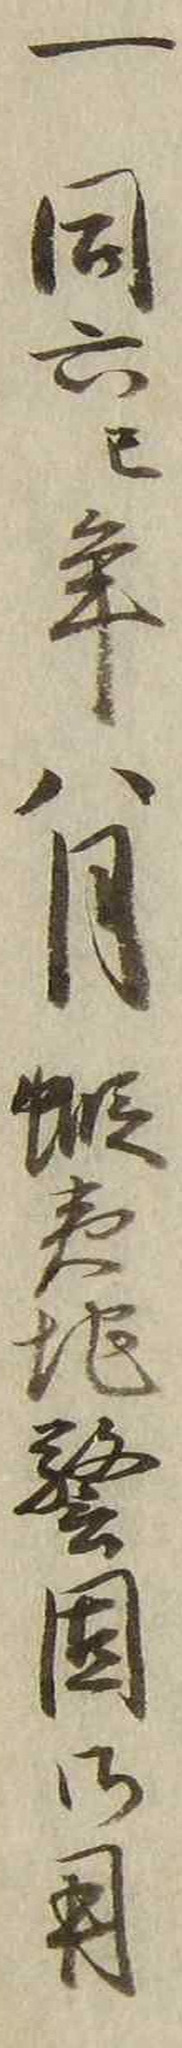一同六巳年八月蝦夷地警固御用

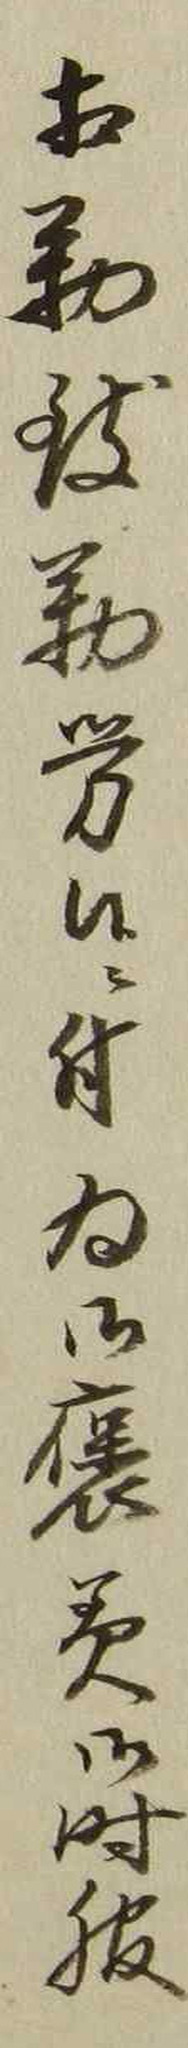相勤致勤労候に付為御褒美御時服
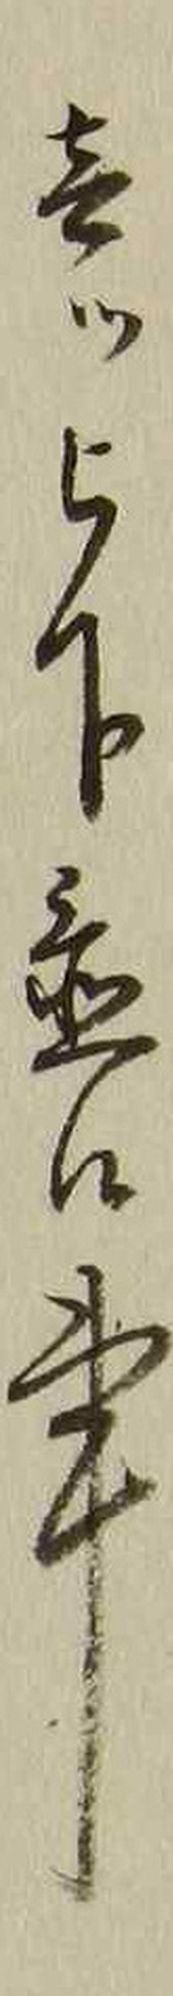壱つ被下置候事
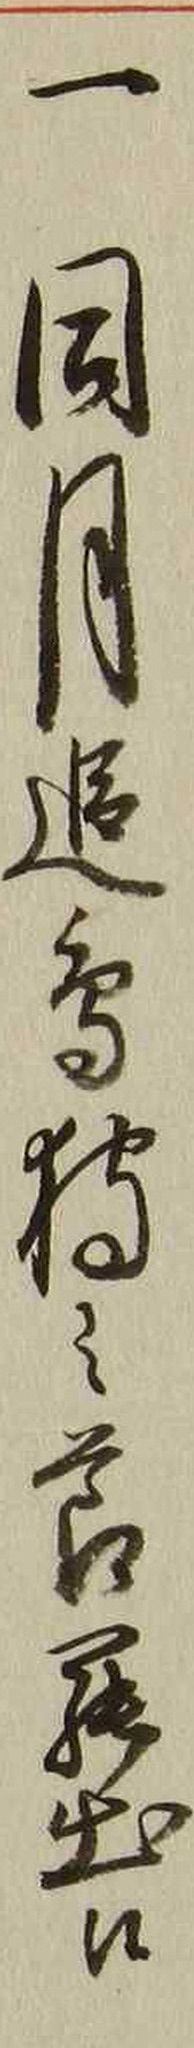一同月追鳥狩之節罷出候
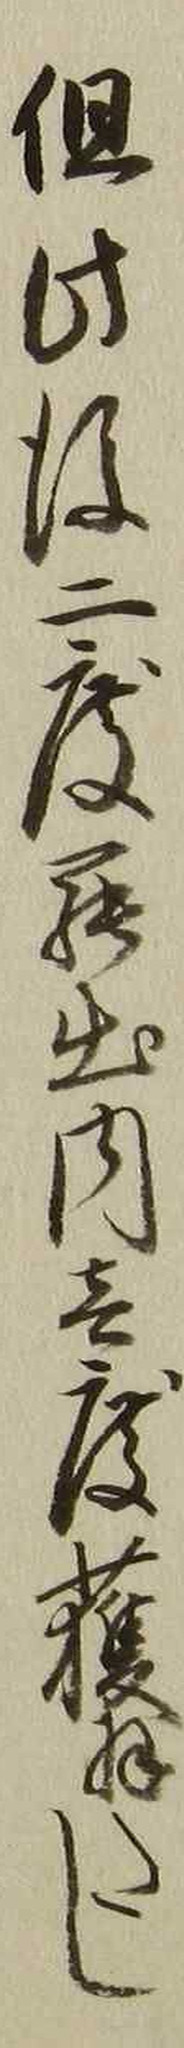但此後度二罷出内壱度獲はたし
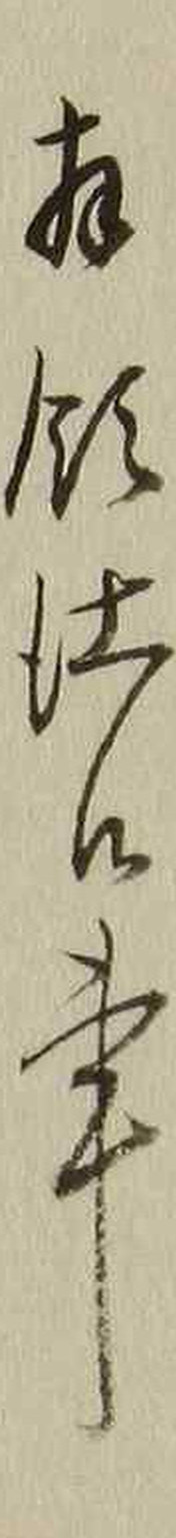拝領仕候事
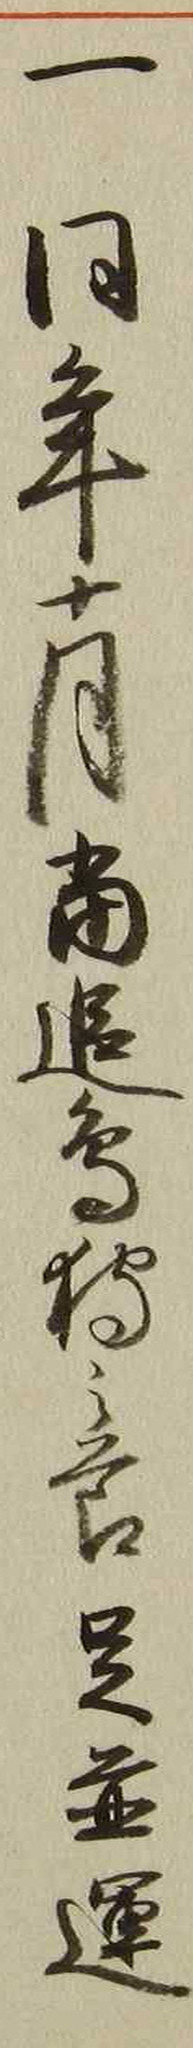一同年十月当追鳥狩之節足並運
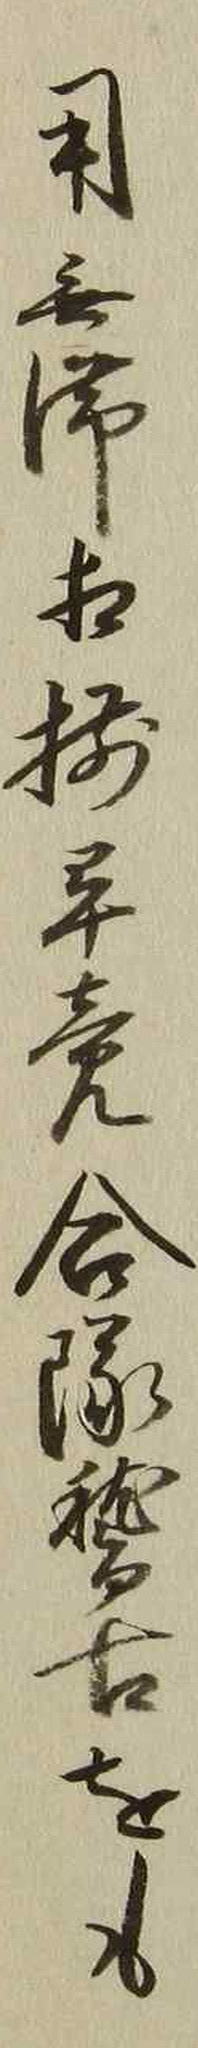用無滞相揃畢竟合隊稽古をも
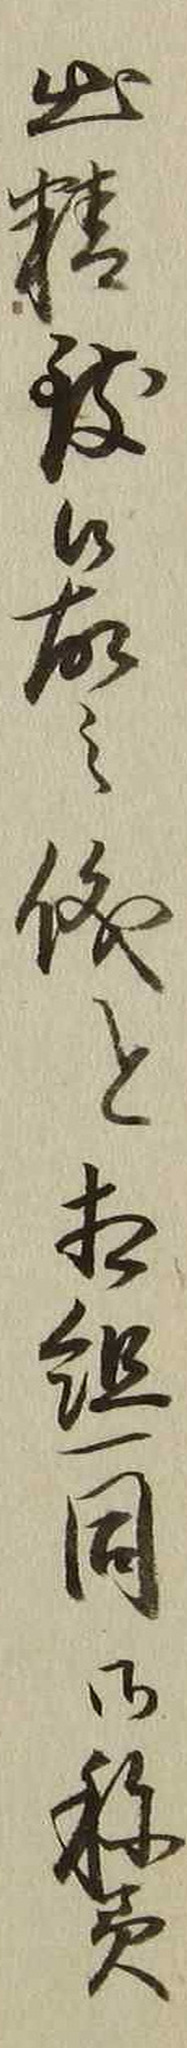出精致候故之儀と相組一同御称美
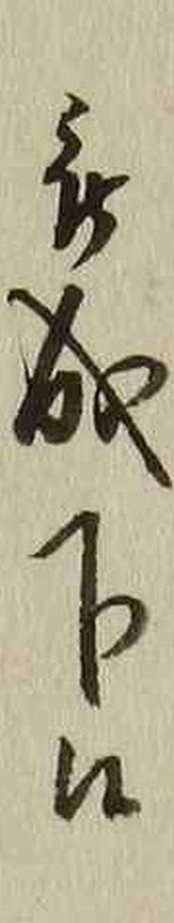被成下候
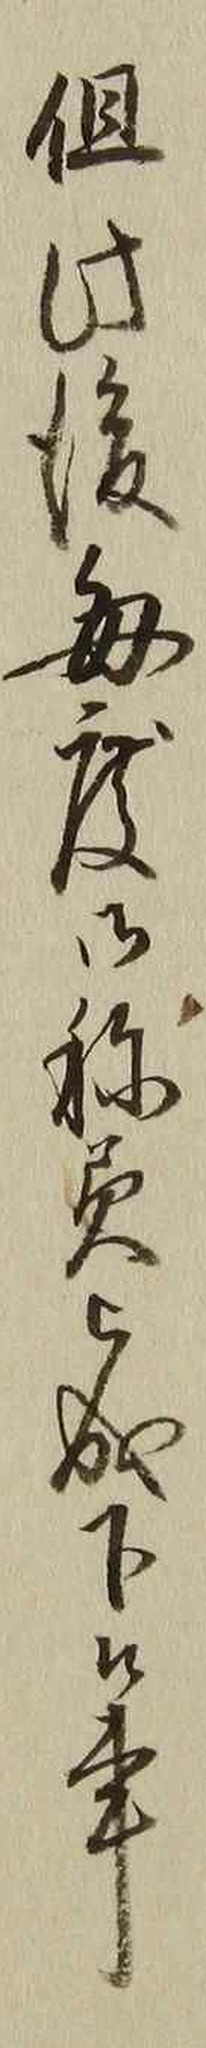但此後毎度御称美被成下候事
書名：諸士系譜　巻之133　た之部9
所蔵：会津若松市立会津図書館
